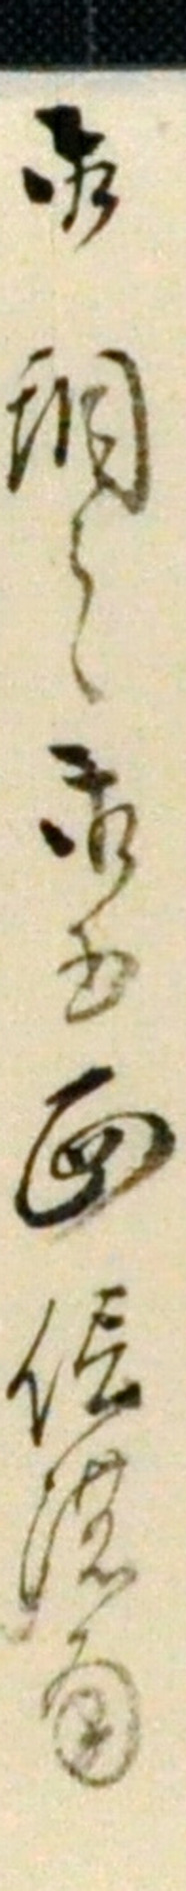御調之御書面信濃殿
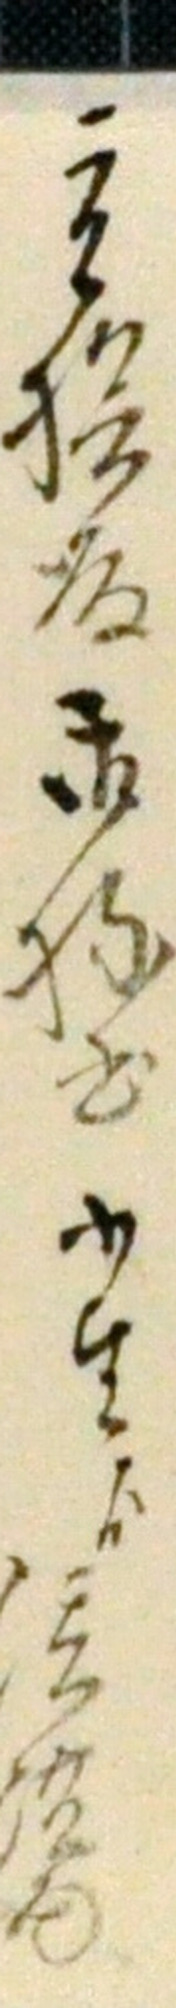主膳殿御持書小生ゟ信濃殿
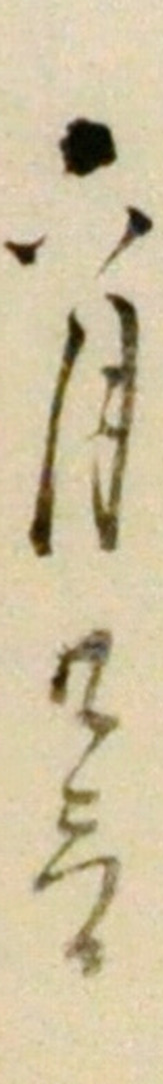六月廿三日
